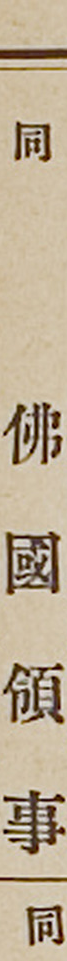同仏国領事
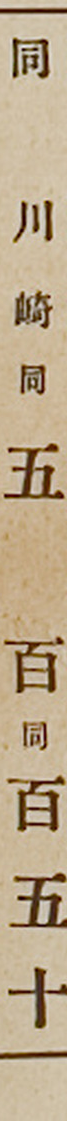同川崎同五百同百五十
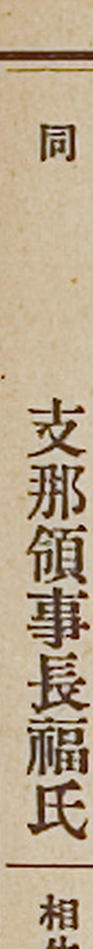同支那領事長福氏
